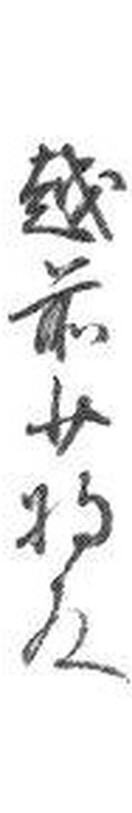越前少将殿
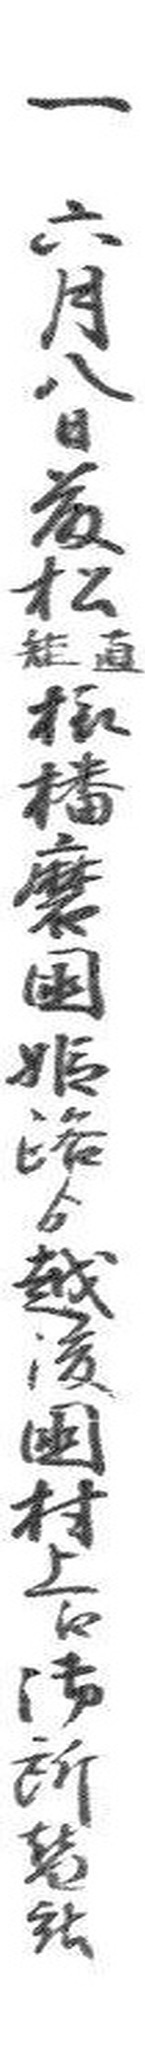一六月八日藤松直矩様播磨国姫路ゟ越後国村上江御所替被
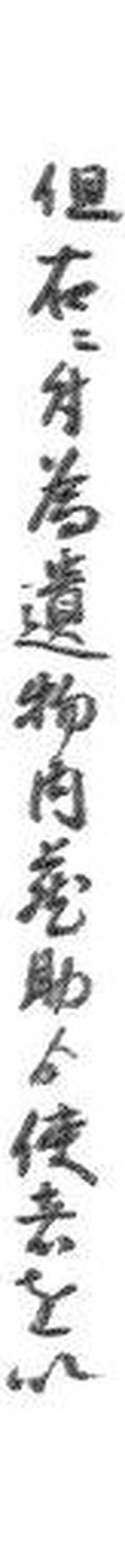但右ニ付為遺物内蔵助ゟ使者を以
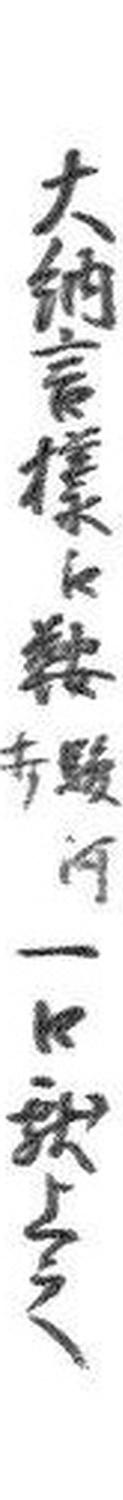大納言様江鞍駿河打一口献上之
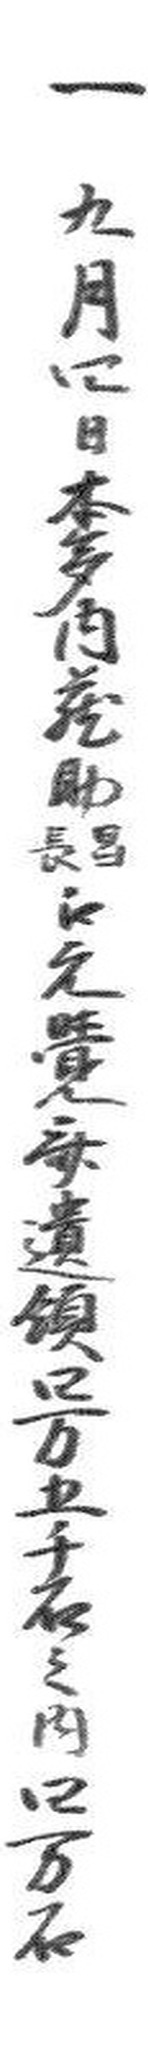一九月四日本多内蔵助昌長江元覚斎遺領四万五千石之内四万石
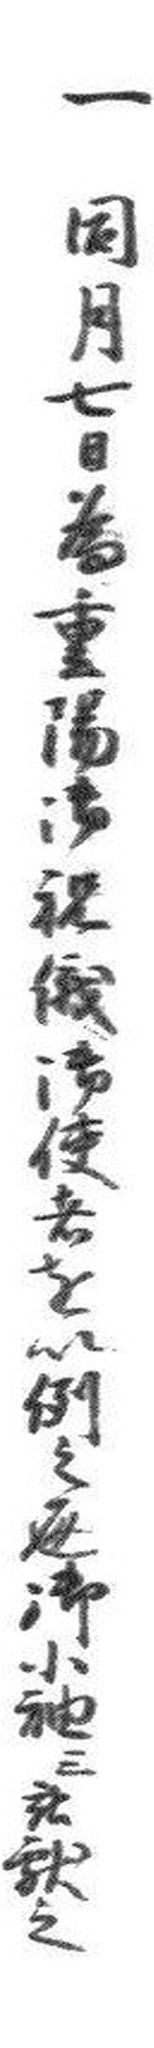一同月七日為重陽御祝儀御使者を以例之通御小袖三被献之
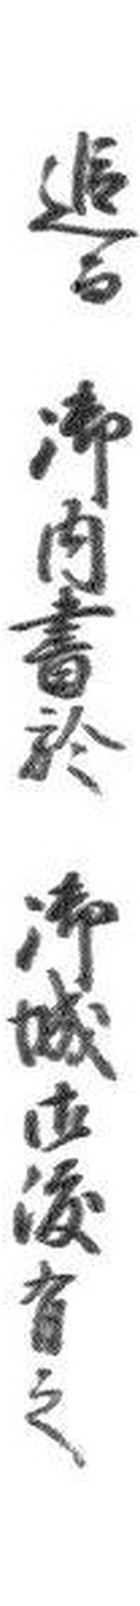追而御内書於御城御渡有之
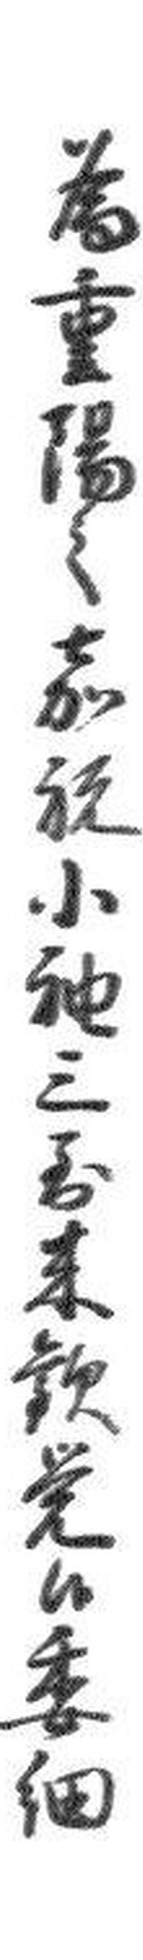為重陽之喜悦小袖三到来歓覚候委細

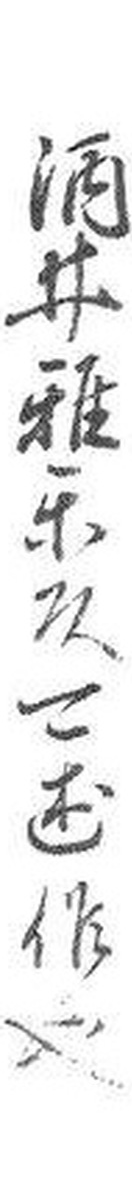酒井雅樂頭可述作也
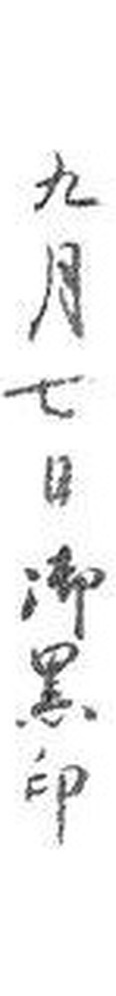九月七日御黒印
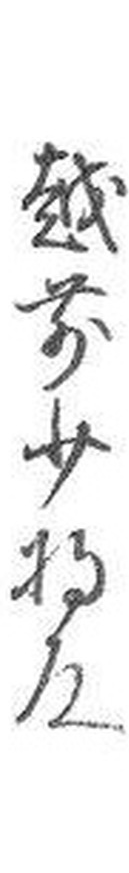越前少将殿
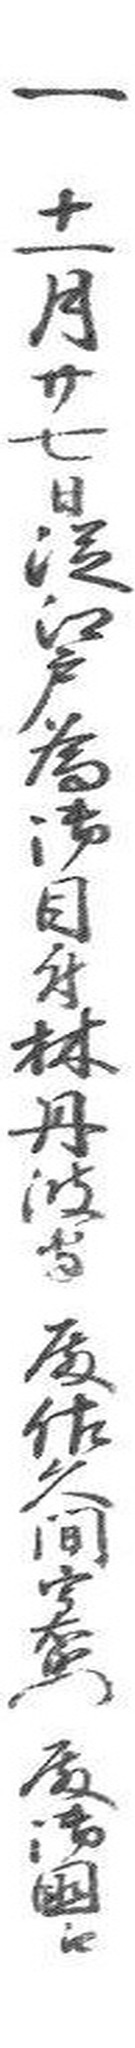一十一月廿七日従江戸為御目付林丹波守殿佐久間宇右衛門殿御国
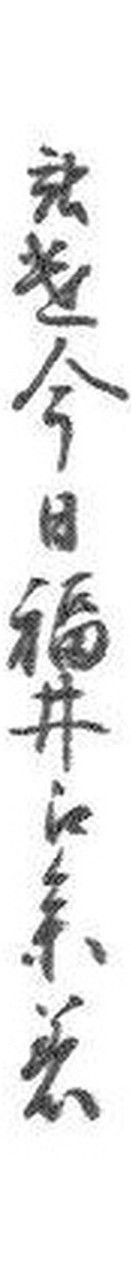被遣今日福井江参着
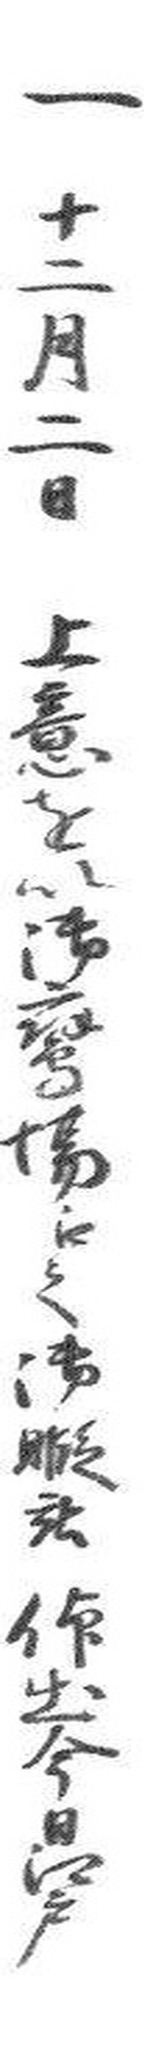一十二月二日上位を以御鷹場江之御暇被仰出今日江戸
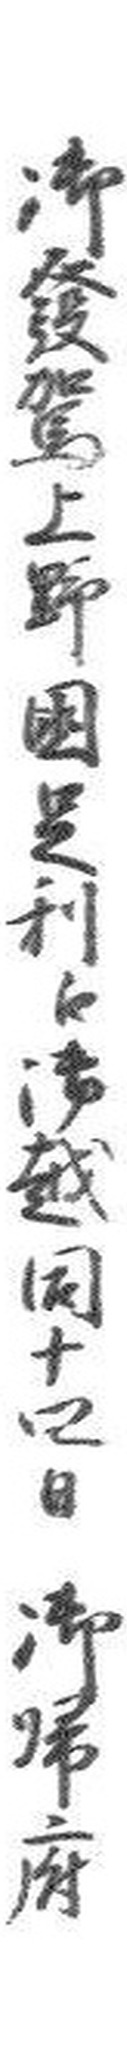御発駕上野国足利江御越同十四日御帰府
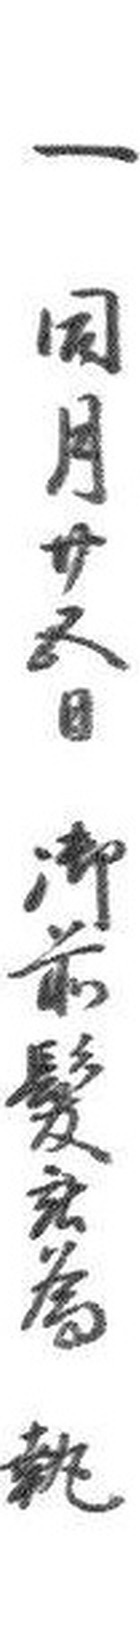一同月廿五日御前髪被為執
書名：家譜 五 光通公 従寛永十三年到万治二年
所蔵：福井県文書館 Fukui Prefectural Archives
